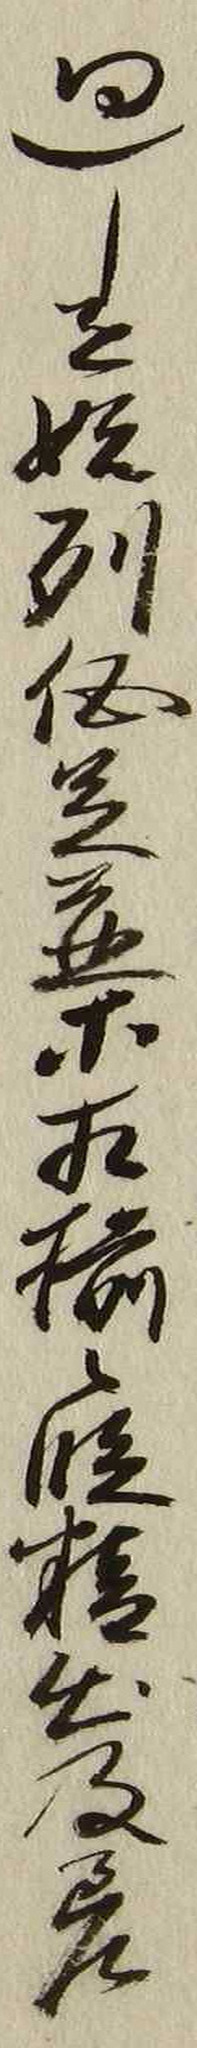廻しを始列伍足並等相揃候段精出及差
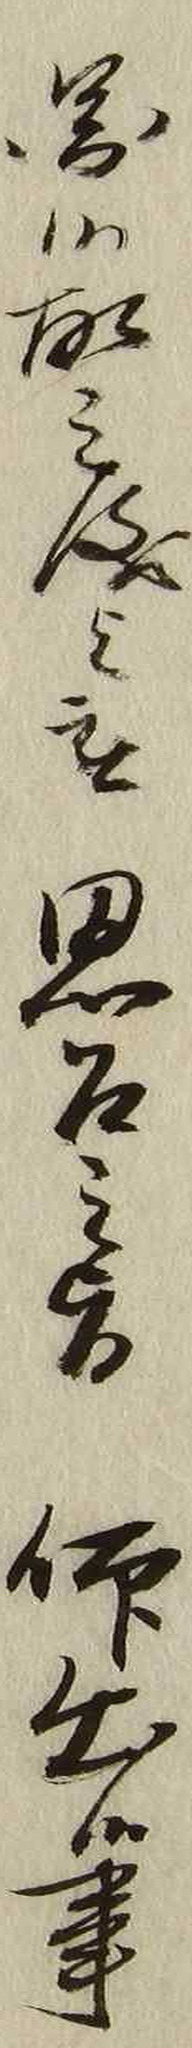図候故之儀与被思召之旨仰出候事
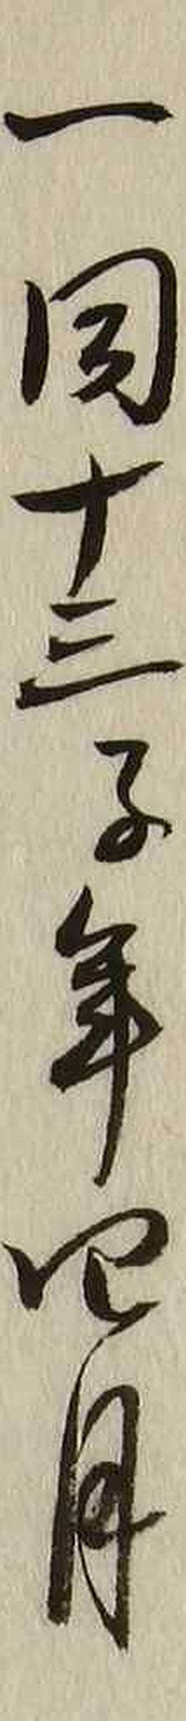一同十三子年四月
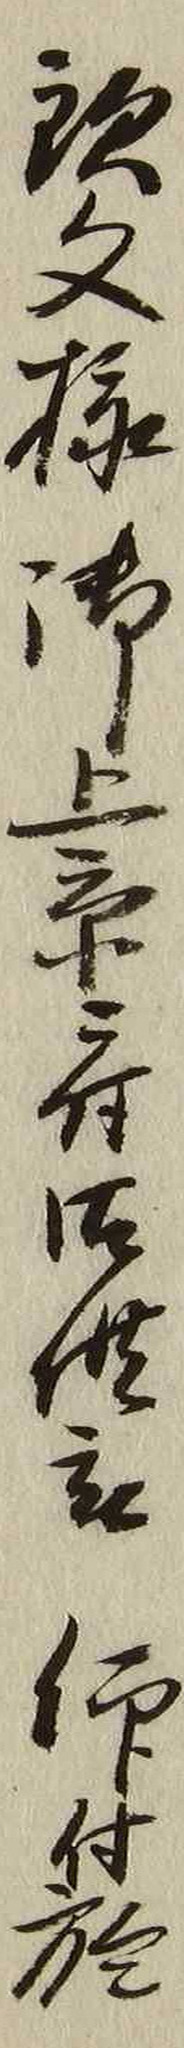欽文様御上京ニ付御供被仰付於
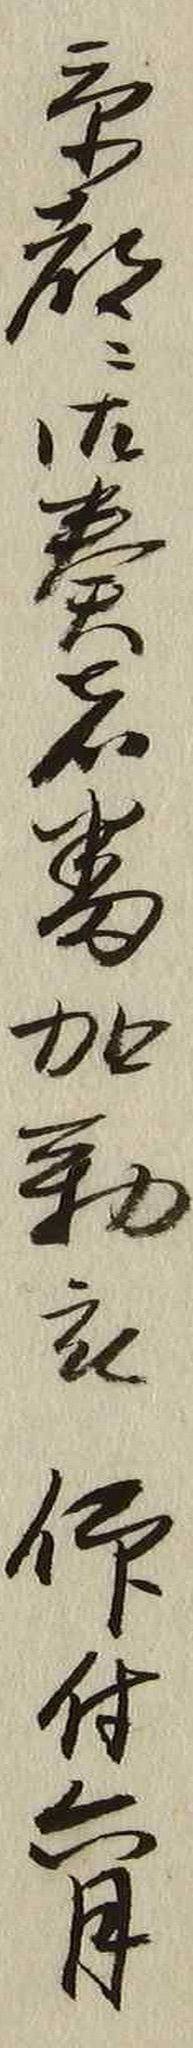京都ニ御奏者番加勤被仰付六月
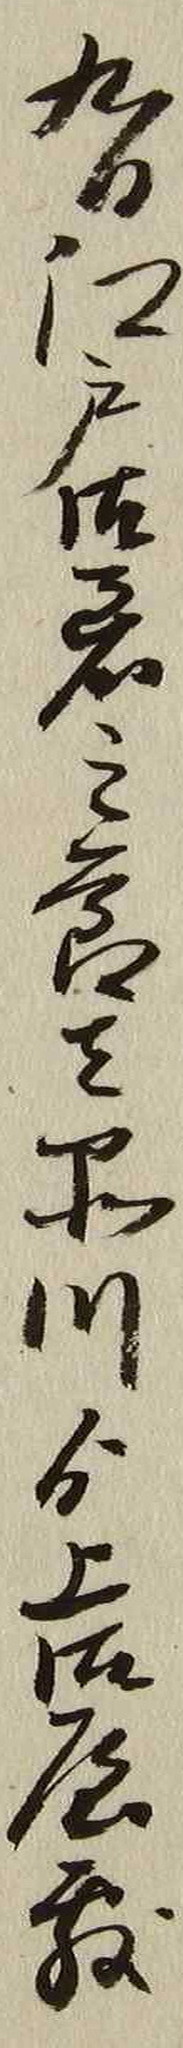九日江戸御着之節者品川ゟ上御屋敷
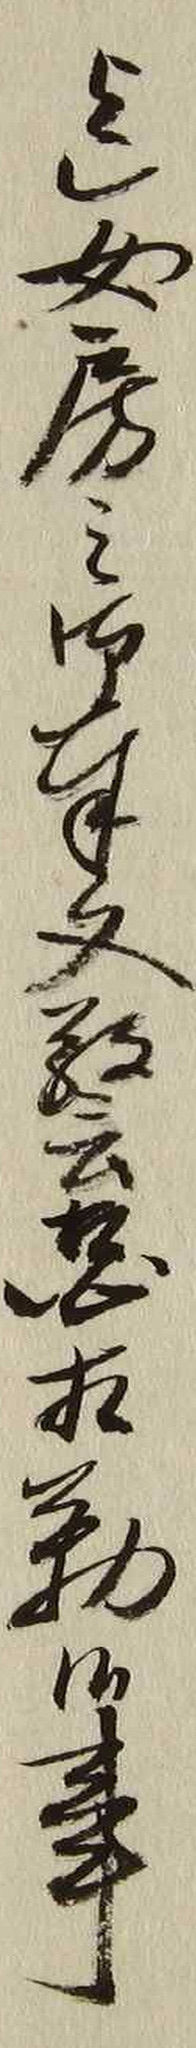迄女房之御奉文警固相勤候事
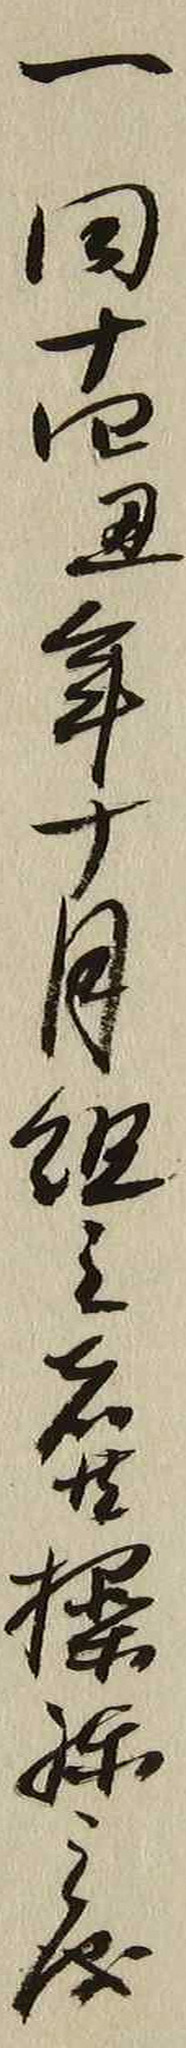一同十四丑年十月組之者共操練之儀
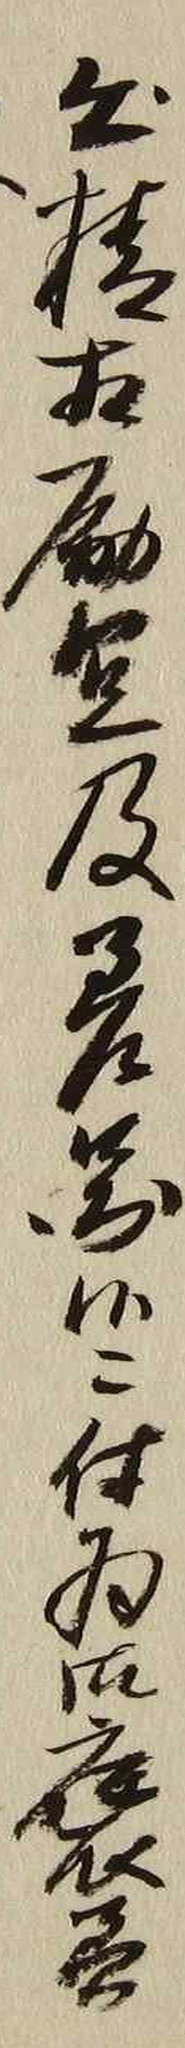出精相励宜及差図候ニ付為御褒美
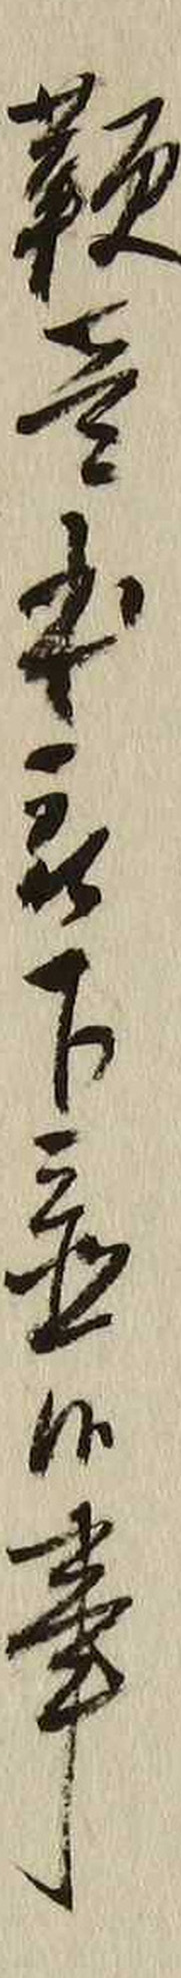鞭壱本被下置候事
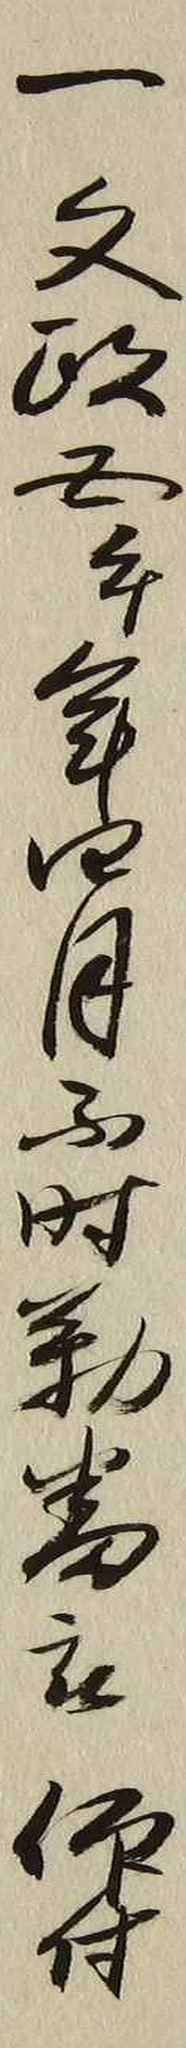一文政五午年四月不時勤番被仰付
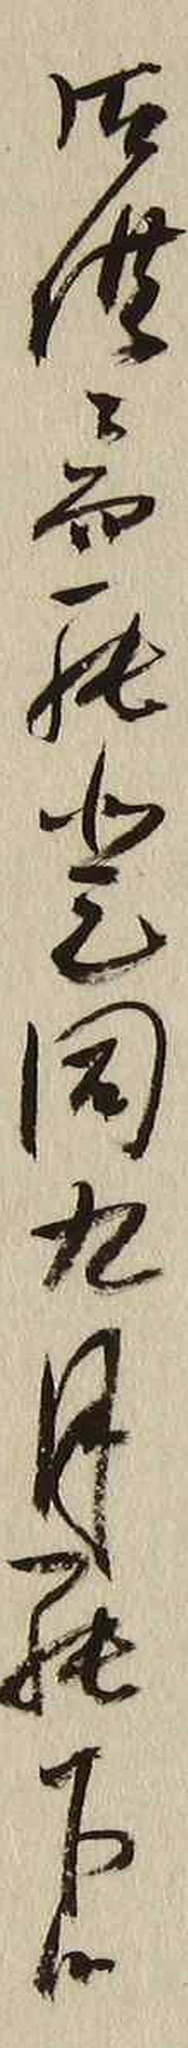御供ニ而罷登同九月罷下候
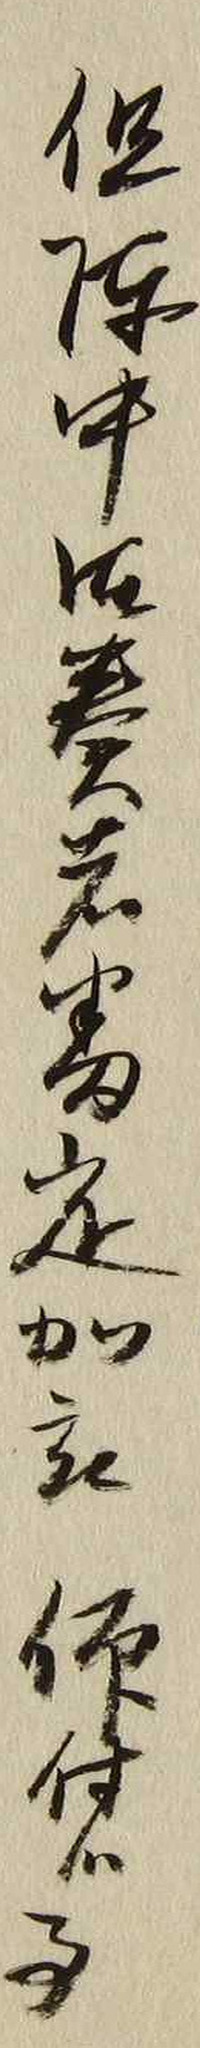但陣中御奏者番定加被仰付候事
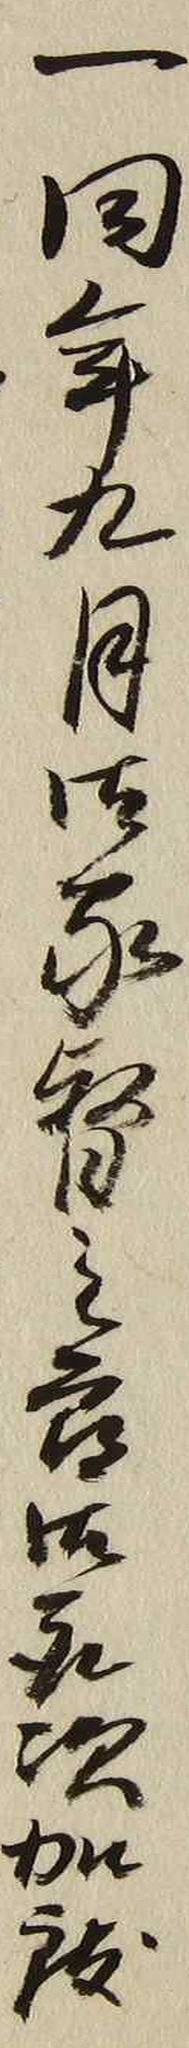一同年九月御家督之節御取次加致
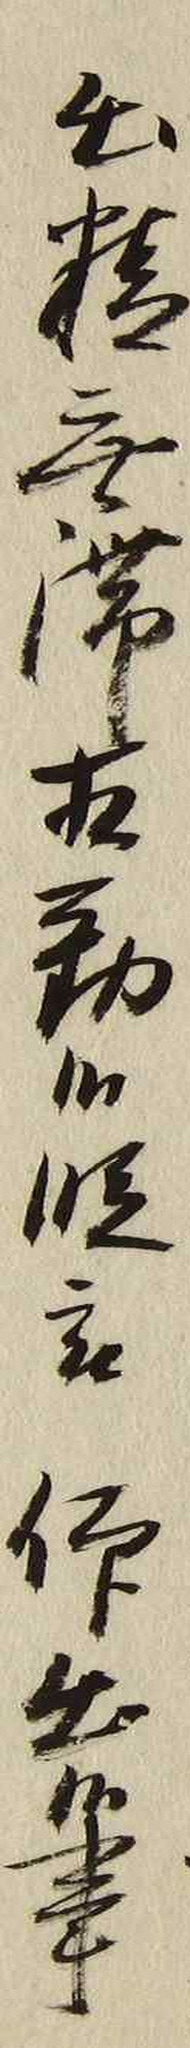出精無滞相勤候段被仰出候事

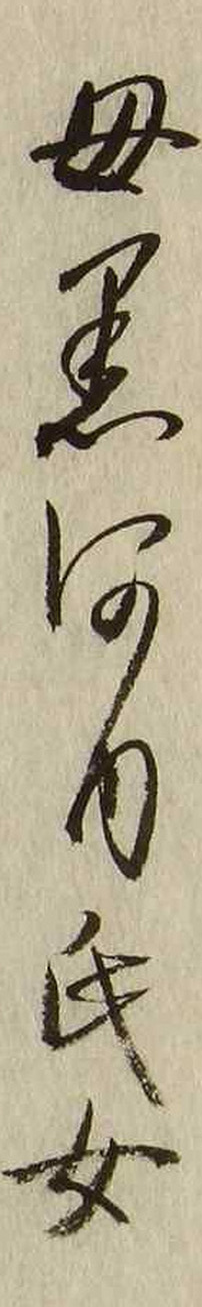母黒河内氏女
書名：諸士系譜　巻之356　す之部6
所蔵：会津若松市立会津図書館
